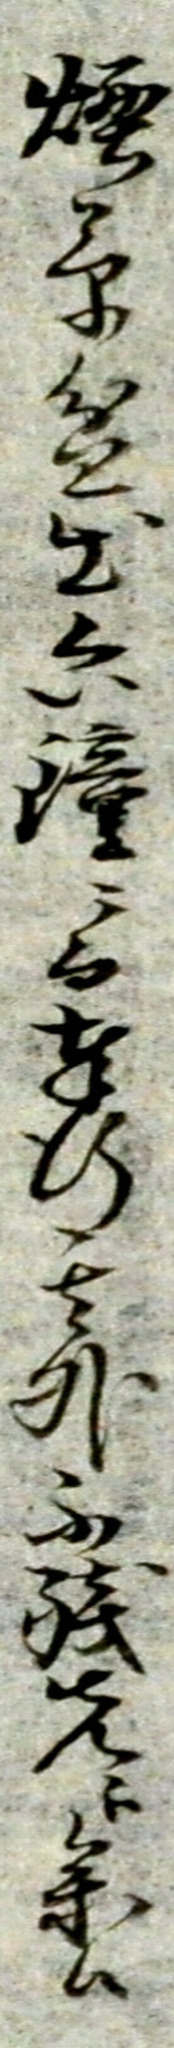煙草盆出六鐘ニ而奉行其外不残先江参候
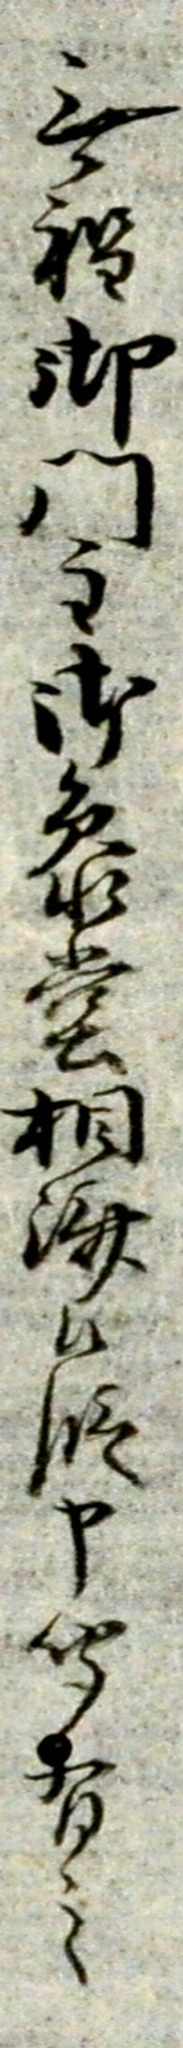無程御門主御参堂相済候段申聞有之
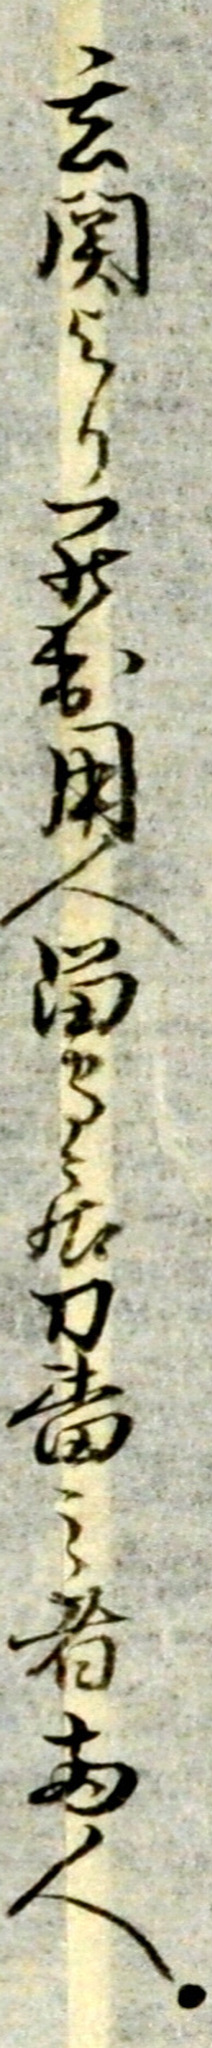玄関より罷出用人留守居刀番之者両人
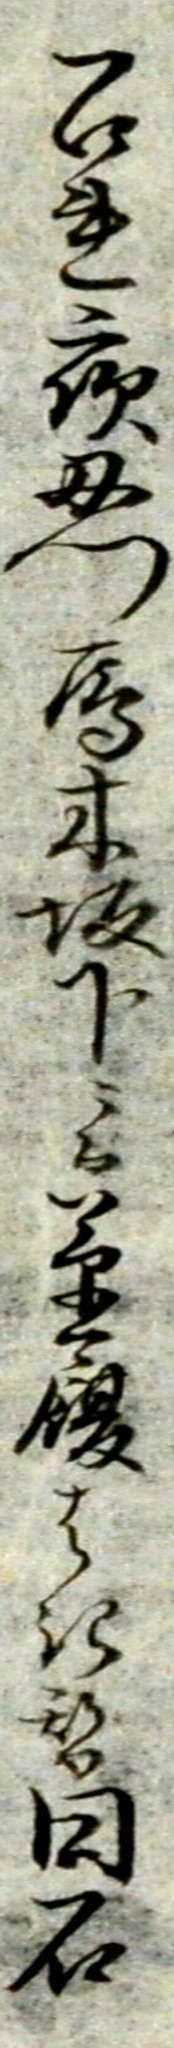召連夜刀門雁木坂下ニ而草履はき替同石
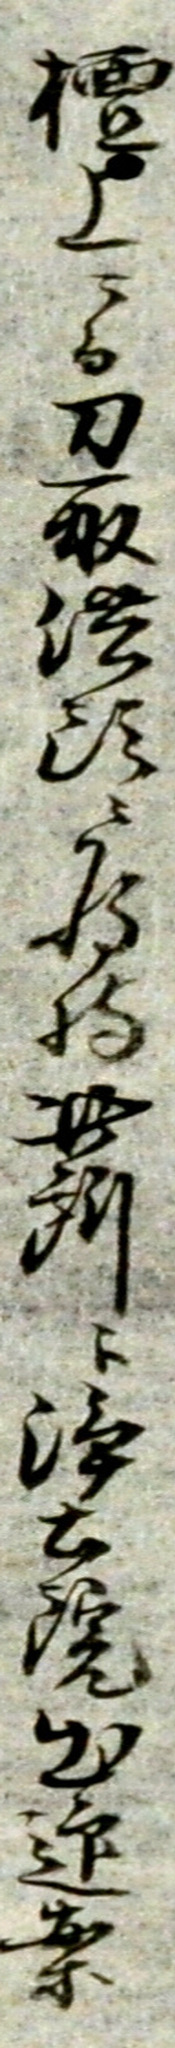檀上ニ而刀取供頭ニ為持此所江浄土院出迎案
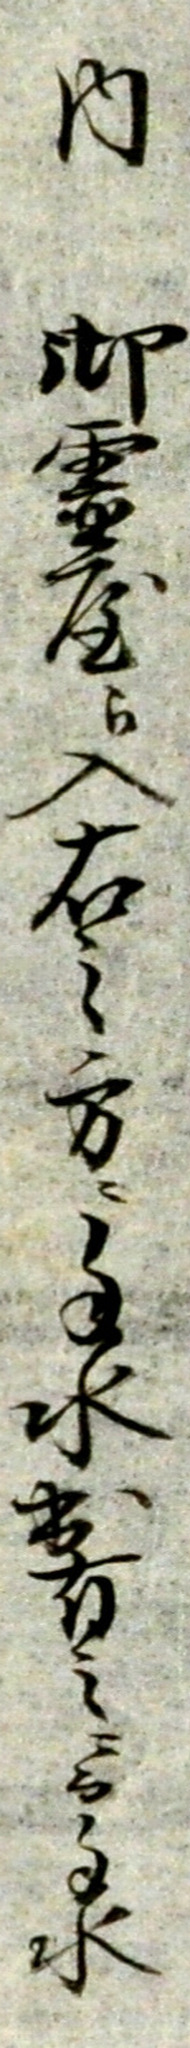内御霊屋江入右之方ニ手水出有之ニ而手水
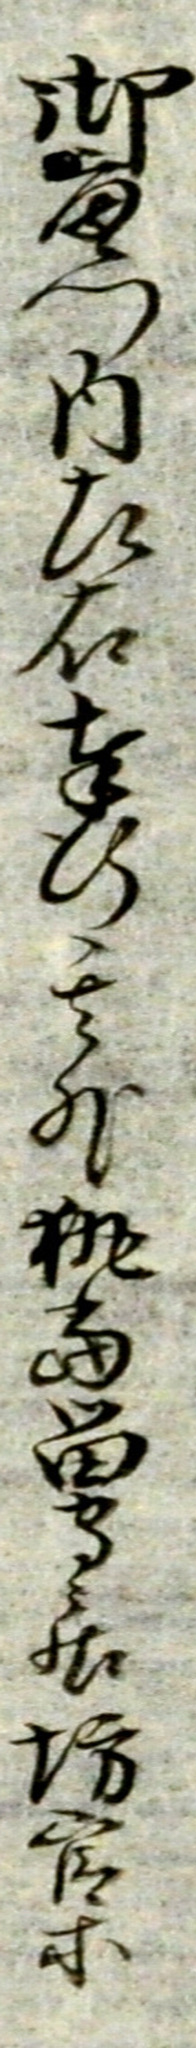御唐門内左右奉行其外執当留守居坊官等
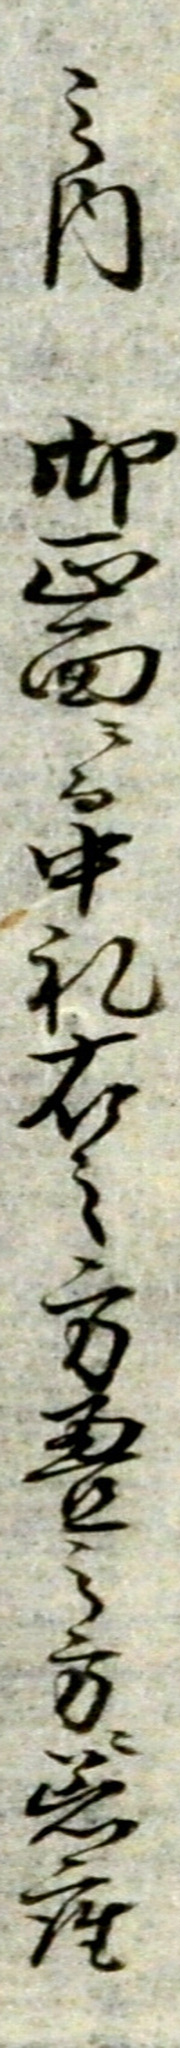之内御正面ニ而中礼右之方畳之方ニ着座
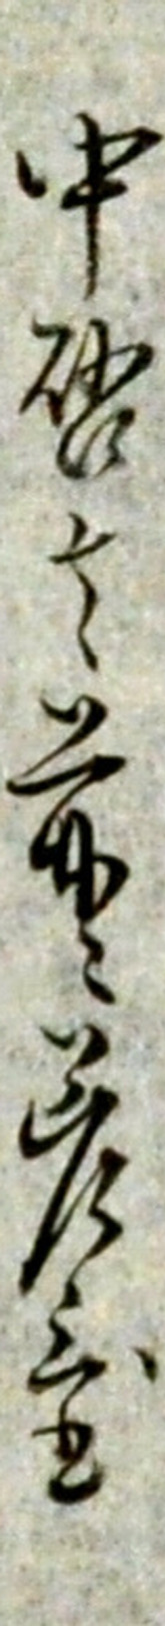中啓者前々差置
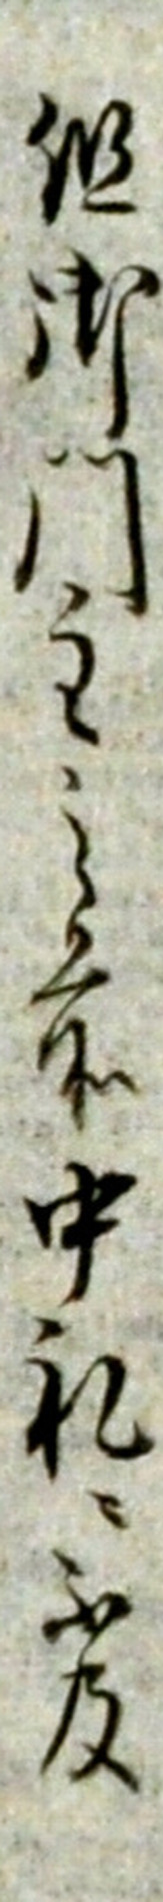但御門主之前中礼ニ不及
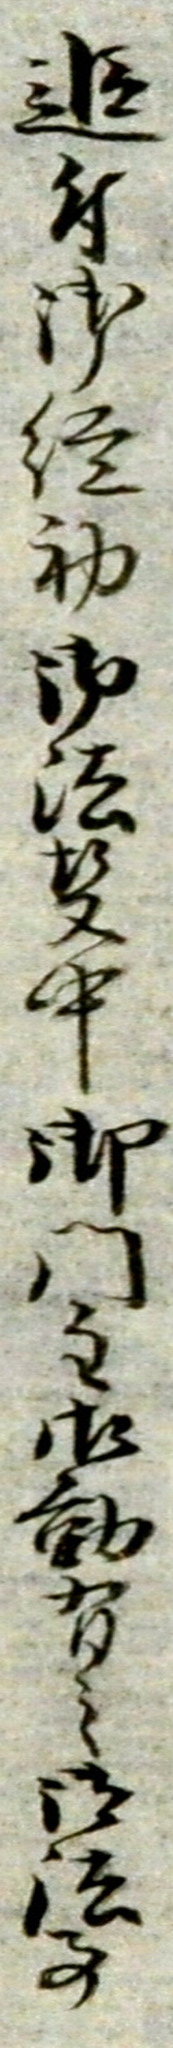追付御経初御法叓中御門主御勤有之御法事

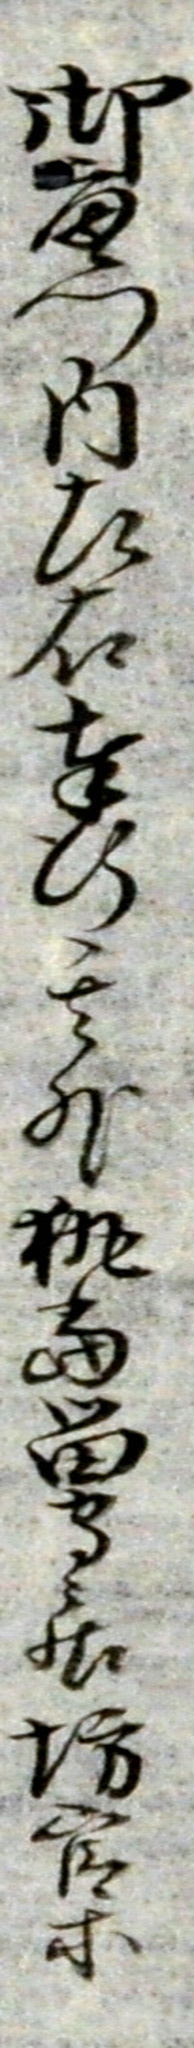御唐門内左右奉行其外執當留守居坊官等
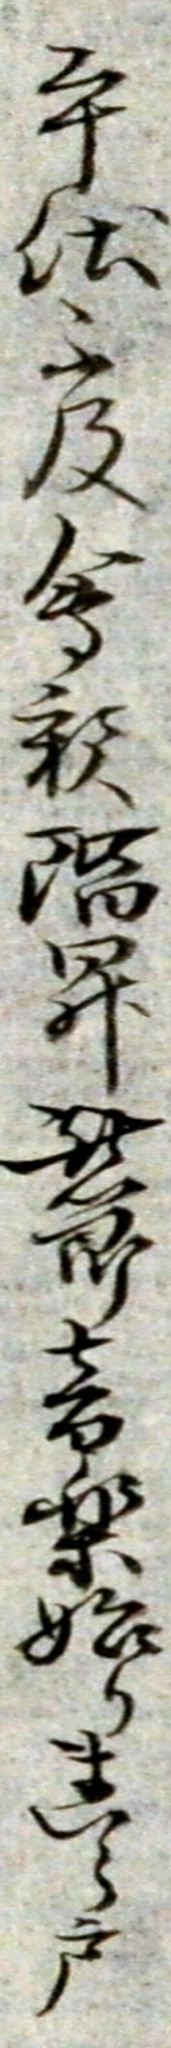平伏不及会釈階昇此節音楽始りまいり戸
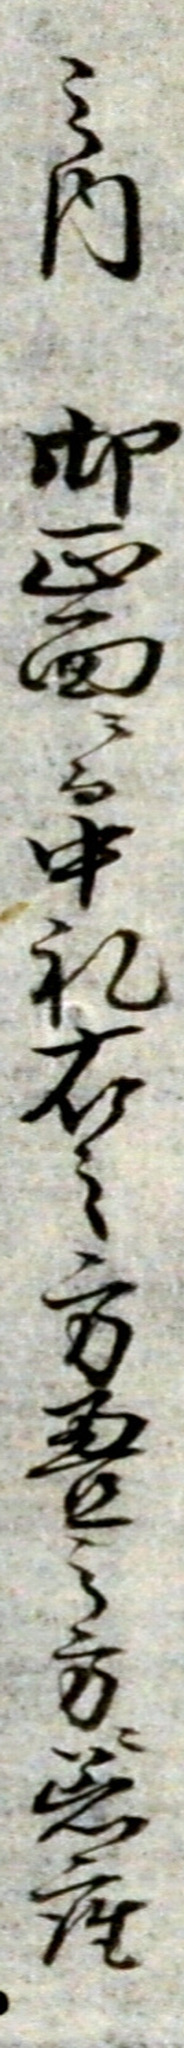之門御正面ニ而中礼右之方畳之方ニ着座
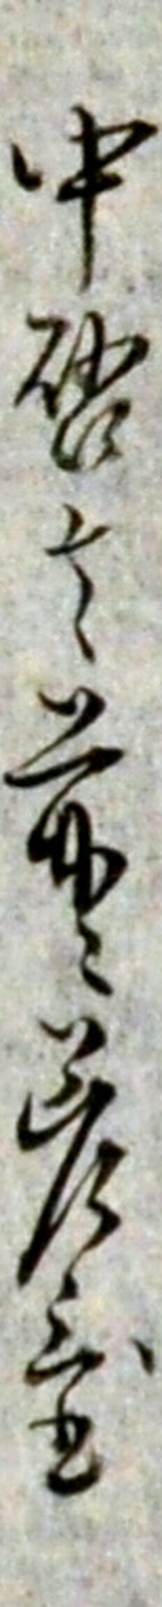中啓者前ニ差置
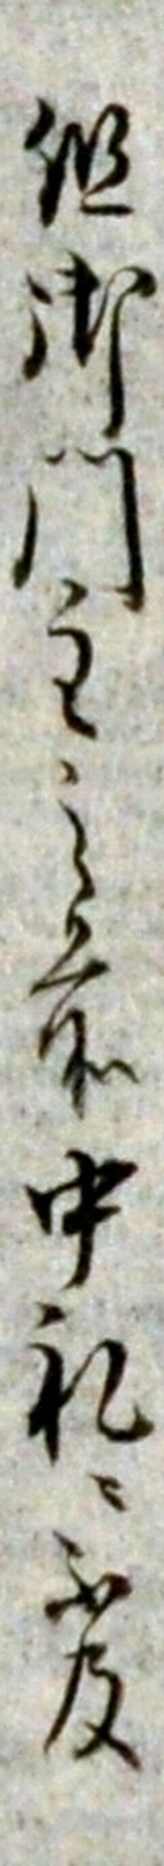但御門主之前中礼ニ不及
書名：日光御名代相勤候節ノ留
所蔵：伊那市立高遠町図書館・合同会社AMANE
